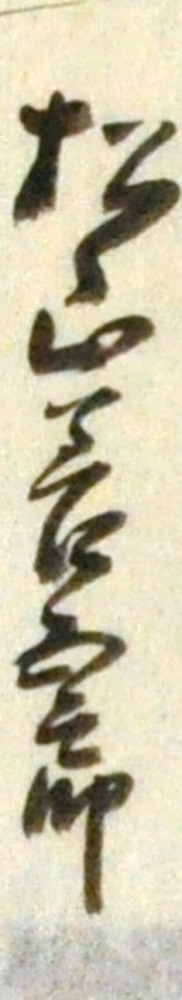松山善五郎
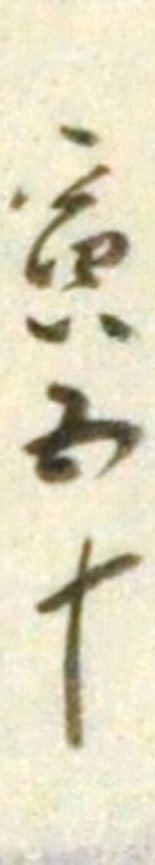寅五十
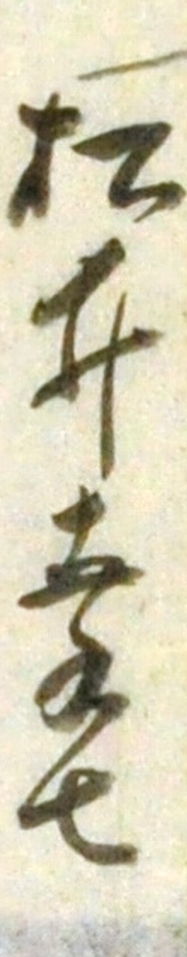松井幸七
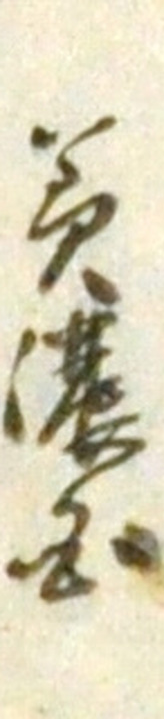美濃国
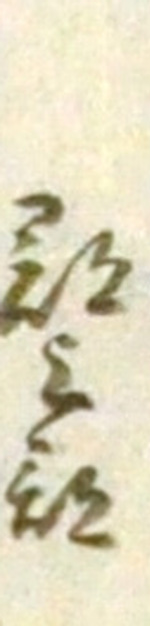郡上郡
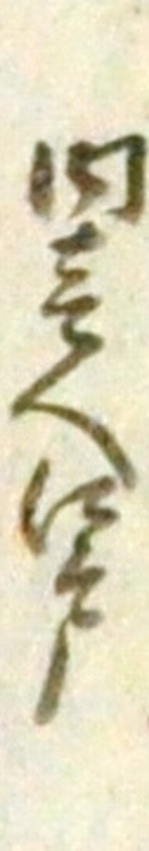内壱人江戸
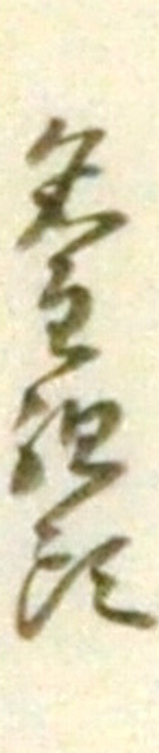名主組頭
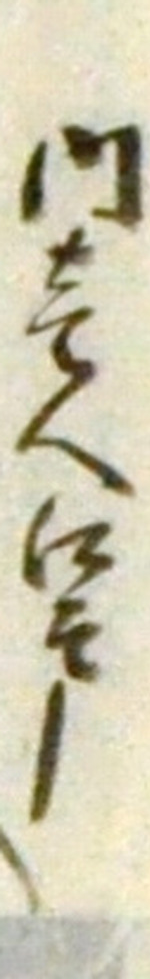内壱人江戸
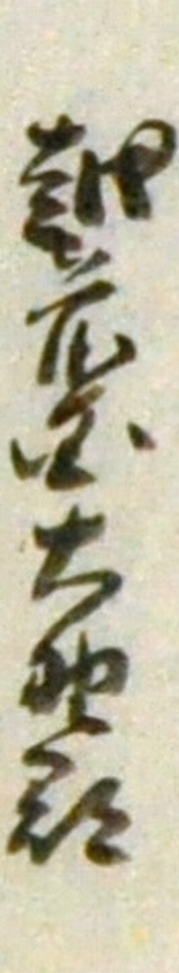越前国大野郡
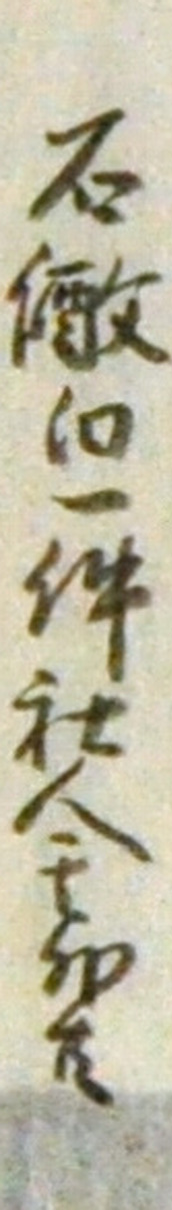石徹白一件社人其外共

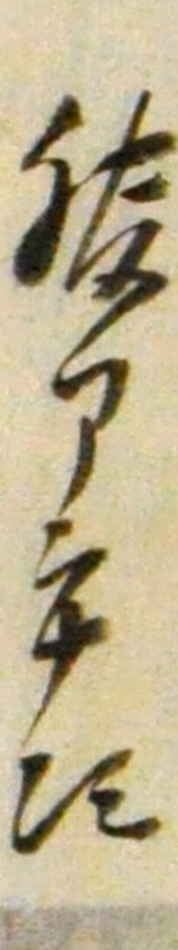服部平次
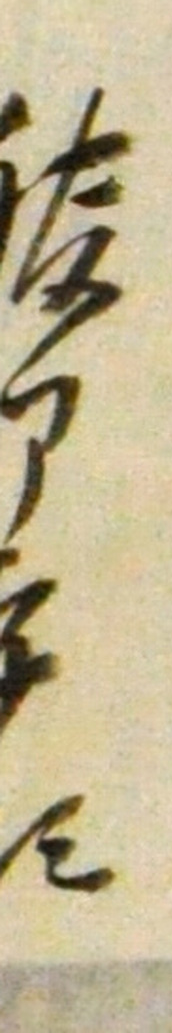服部平次
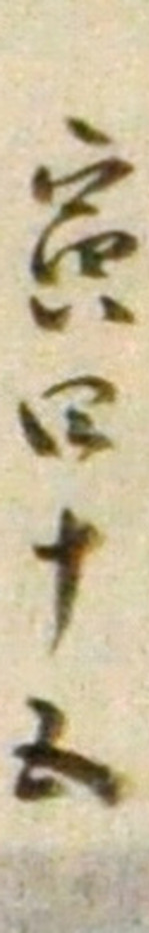寅四十五
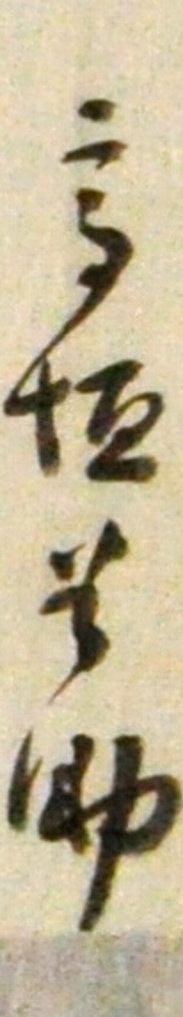高垣兵助
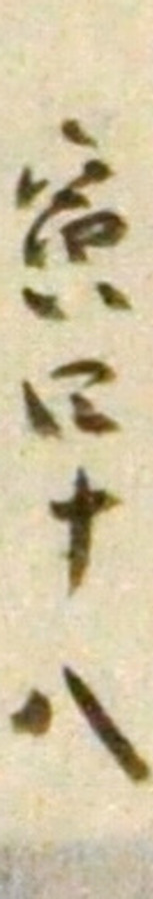寅四十八
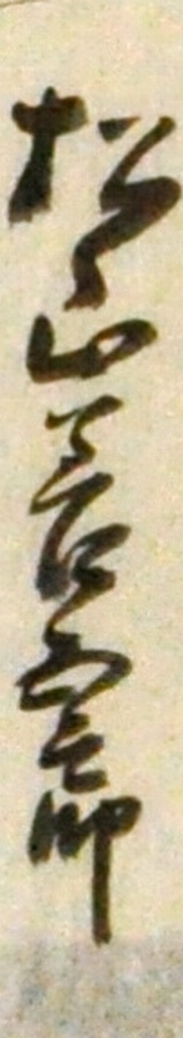松山善五郎
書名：罪状判決
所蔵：伊那市立高遠町図書館・合同会社AMANE
